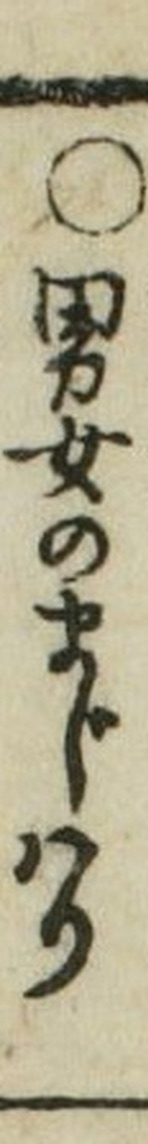○男女のまじはり
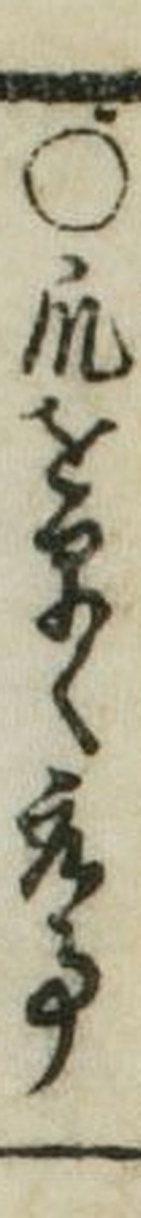○爪を早く取事
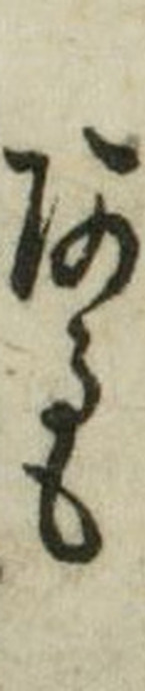あるも
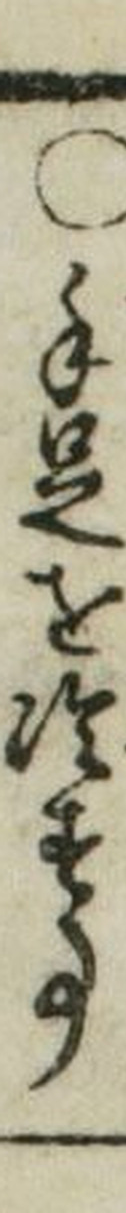○手足を冷す事
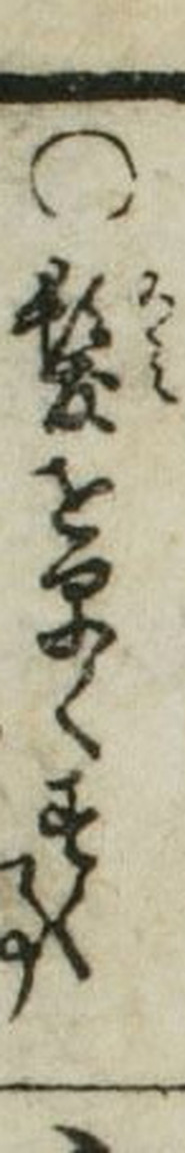○髪を早くすく事
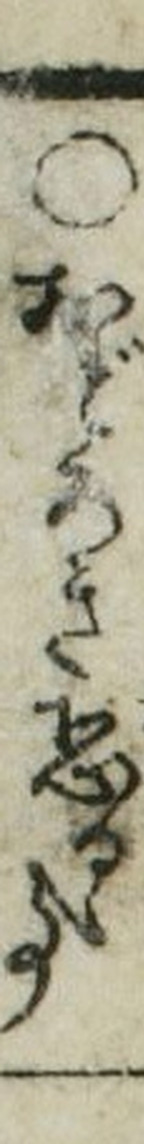○おどろき恐るゝ事
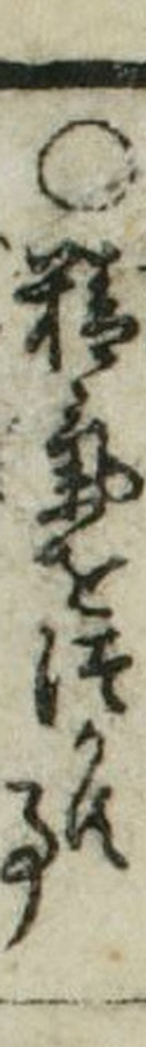○精気をつかす事
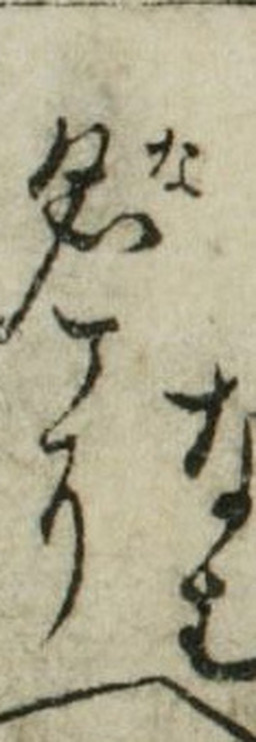名こそ
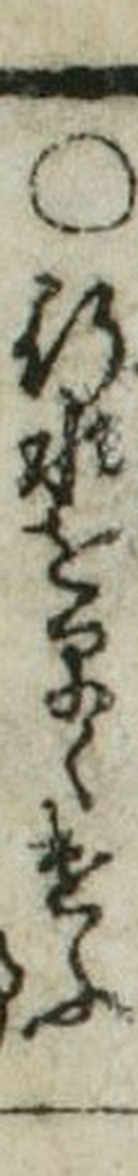○行水を早く遣う事
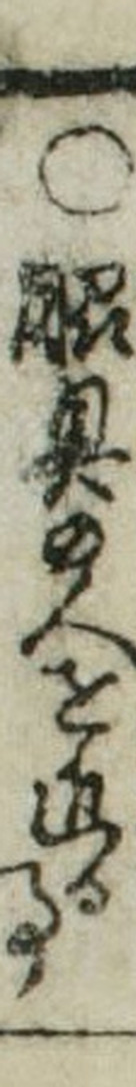○脇臭の人を近る事

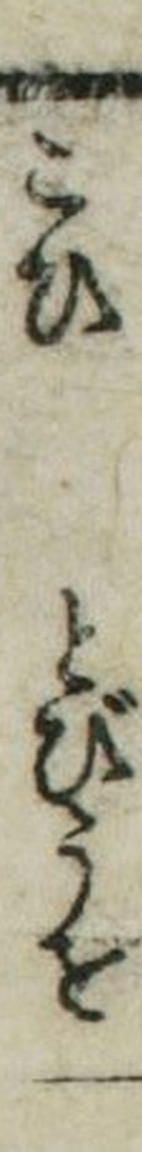こひとびうを
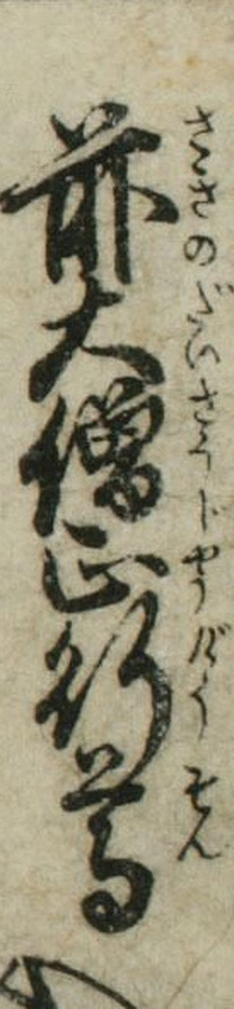前大僧正行尊
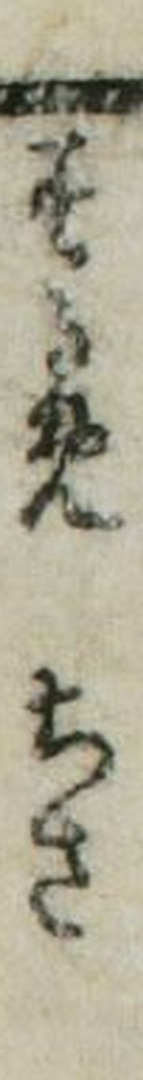するめちさ
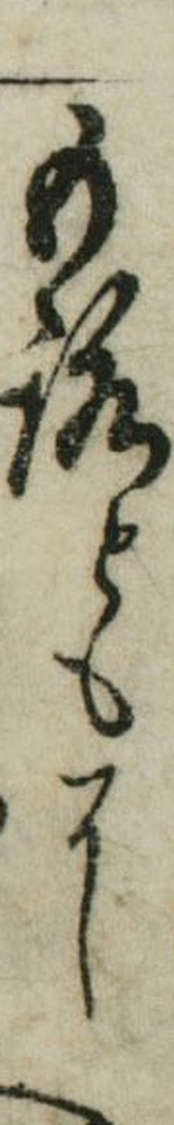もろともに
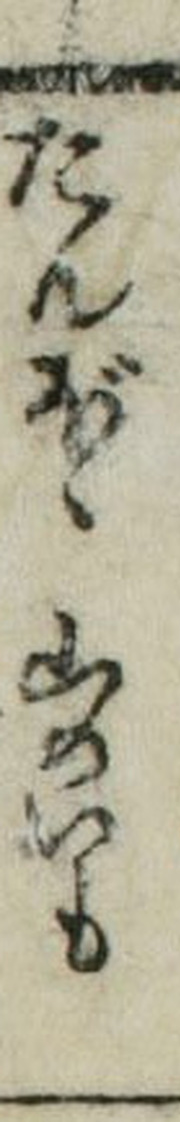たんぼゝ山のいも
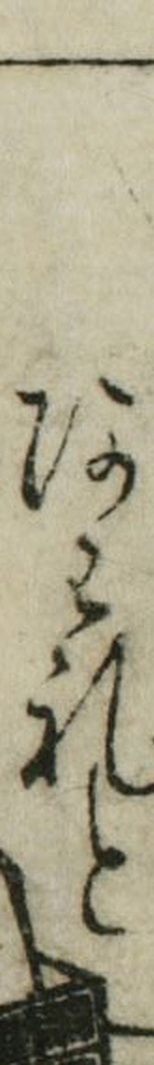あわれと
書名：百人一首
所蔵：東京学芸大学教育コンテンツアーカイブ
